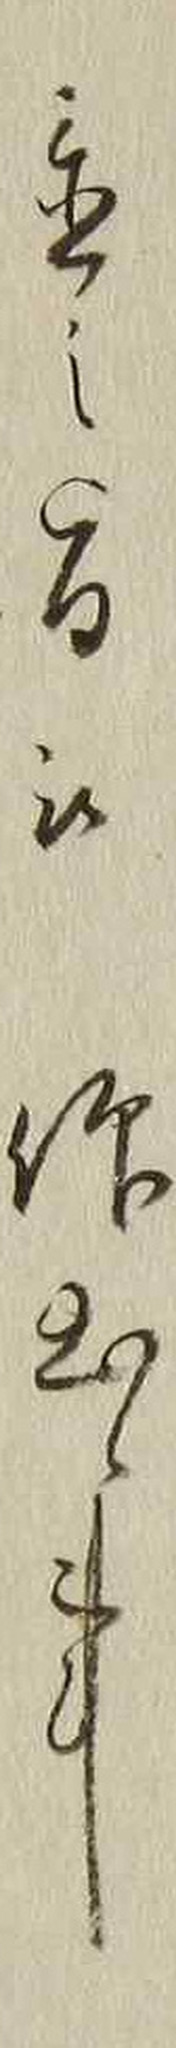置之旨被仰出候事
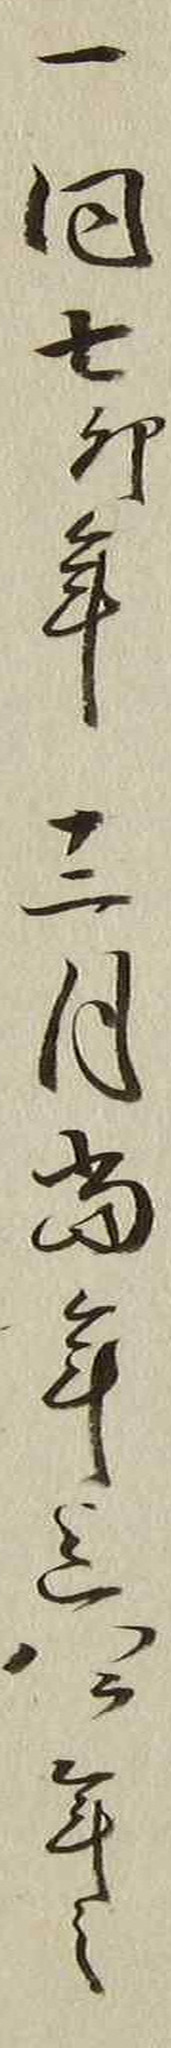一同七卯年十二月当年迄八ヶ年之
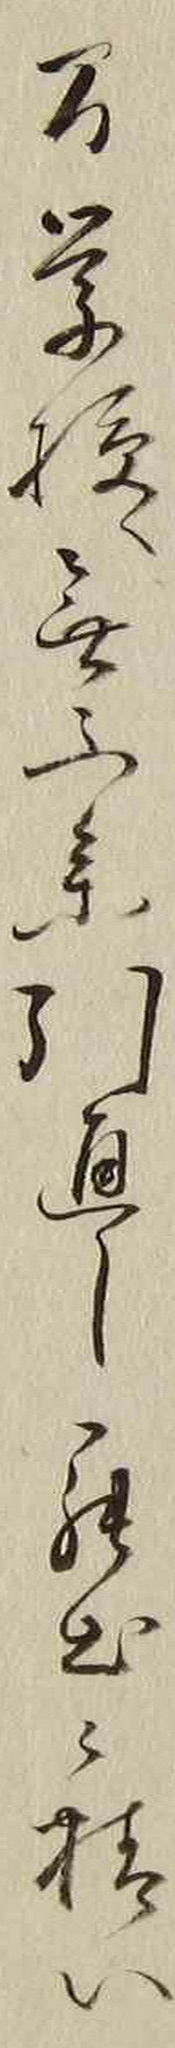間学校へ無不参引通し罷出々精い
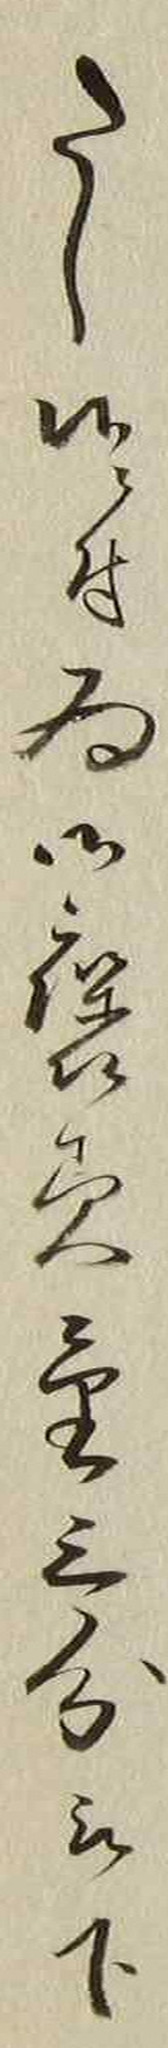たし候ニ付為御褒美金三分被下
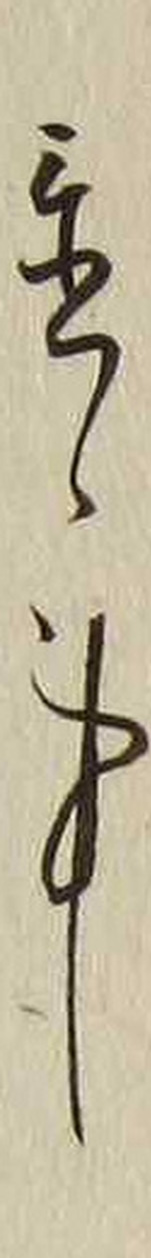置候事

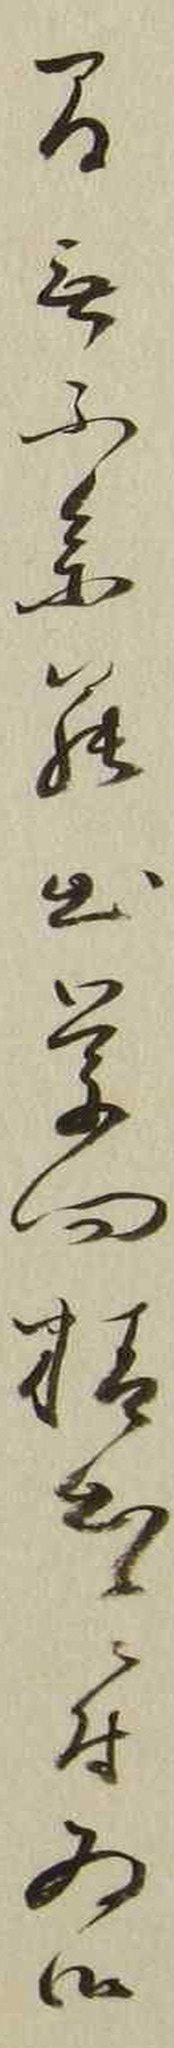間無不参罷出学問精出候ニ付為御
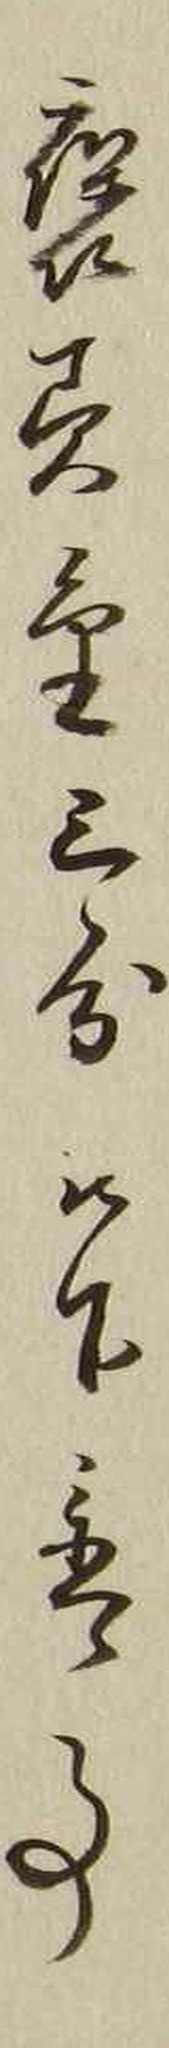褒美金三分被下置候事
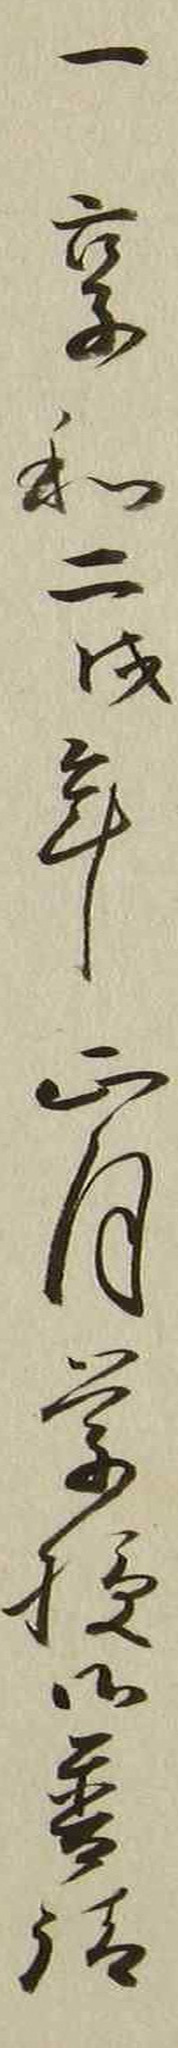一享和二戌年正月学校御普請
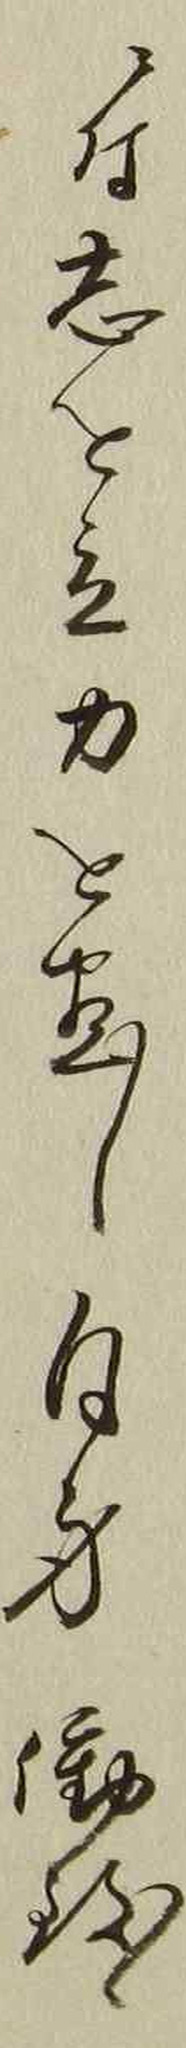ニ付志を立力を尽し自身働致候
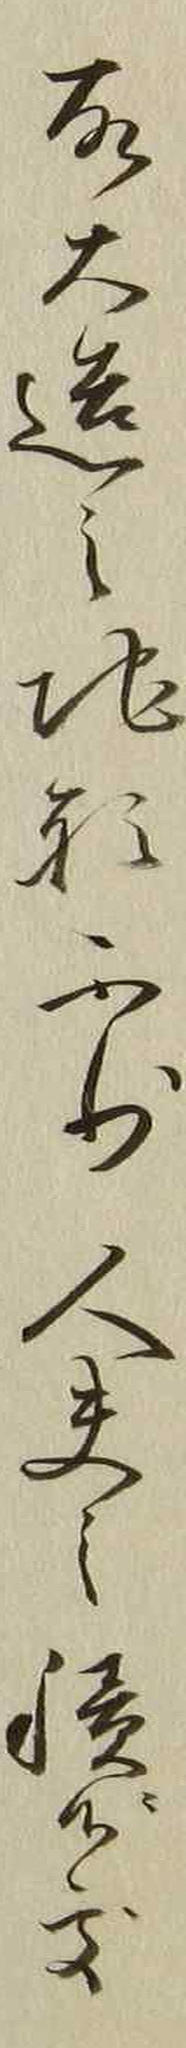故大造之地形不少人夫之積ニ候処
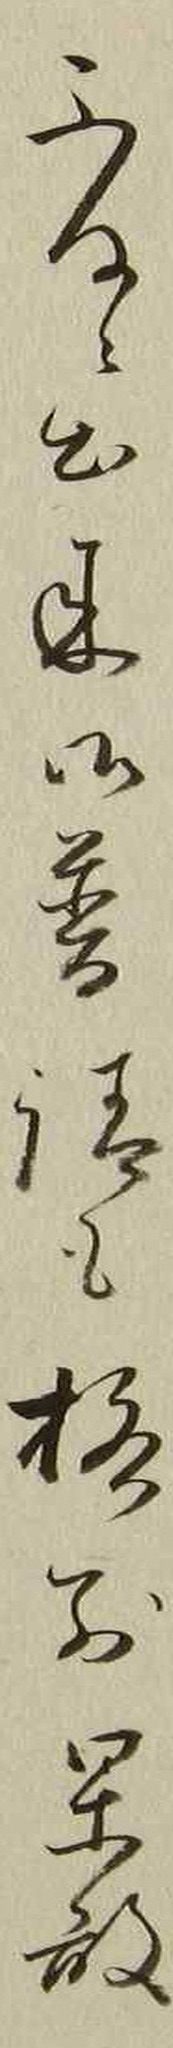不日ニ出来御普請も格別果敢
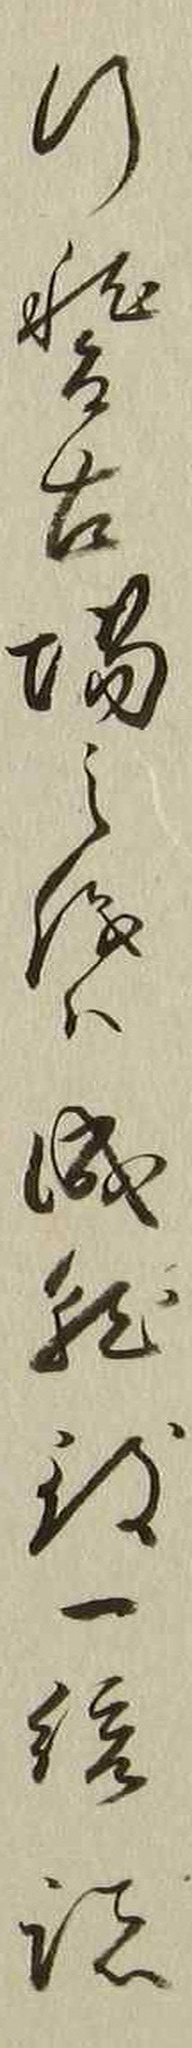行稽古場之儀ハ成就致一統諸
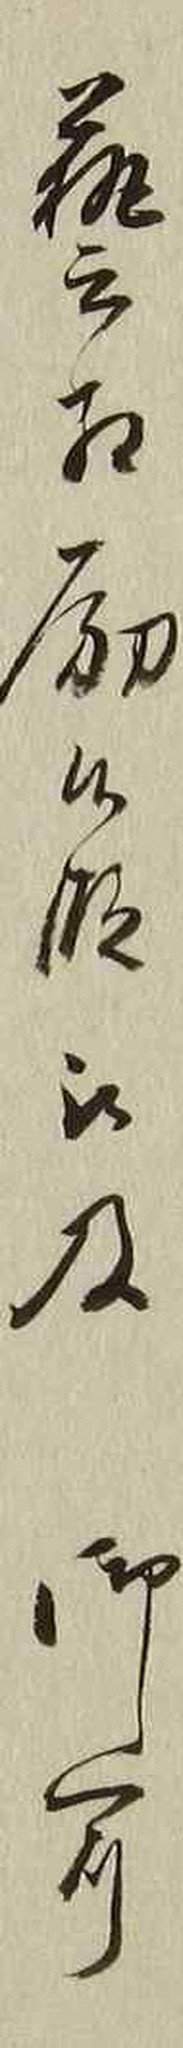衆立相励候段被及御聞
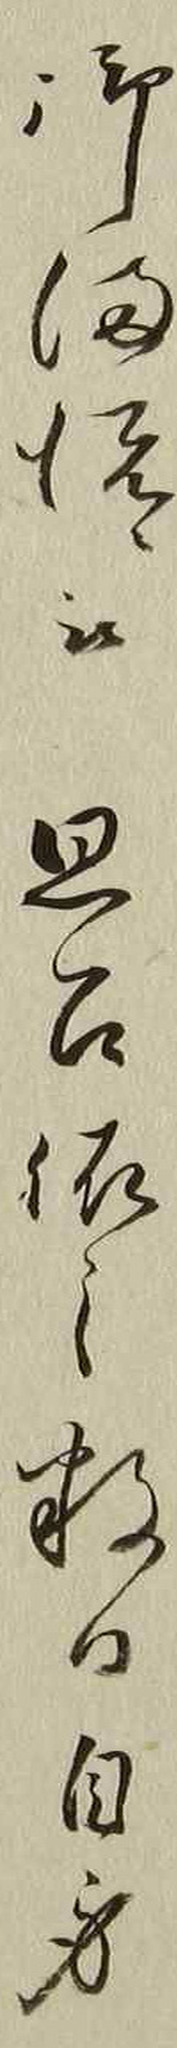御満悦ニ被思召依之数日自身
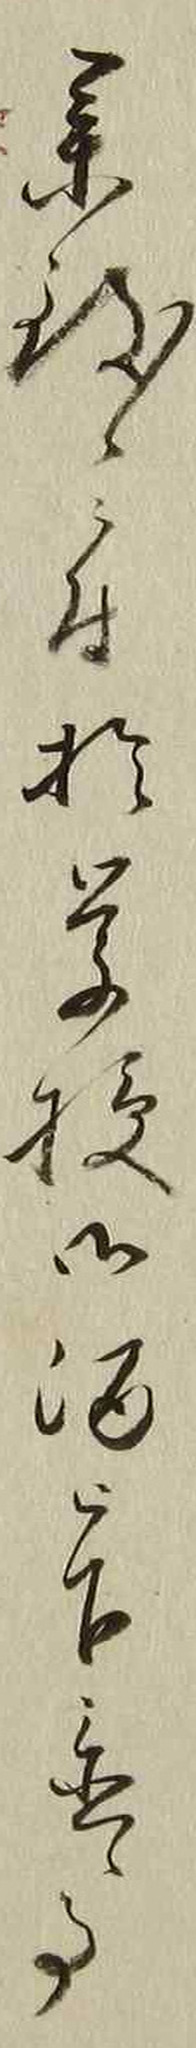参致候ニ付於学校御酒被下置候事
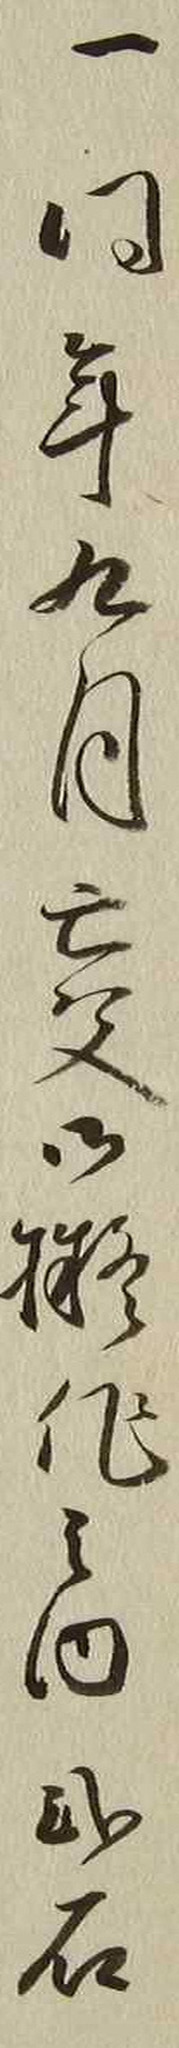一同年九月亡父御擬作之内弐石
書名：諸士系譜　巻之52　に之部3
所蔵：会津若松市立会津図書館
